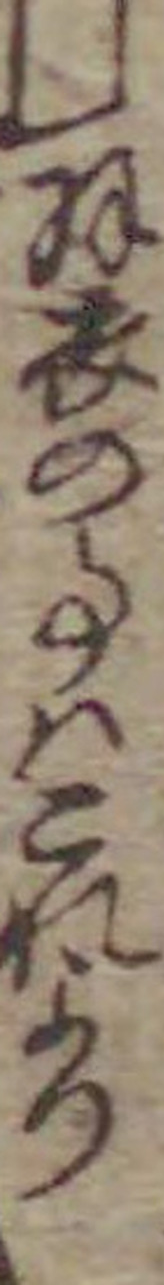羽衣の事はこれより
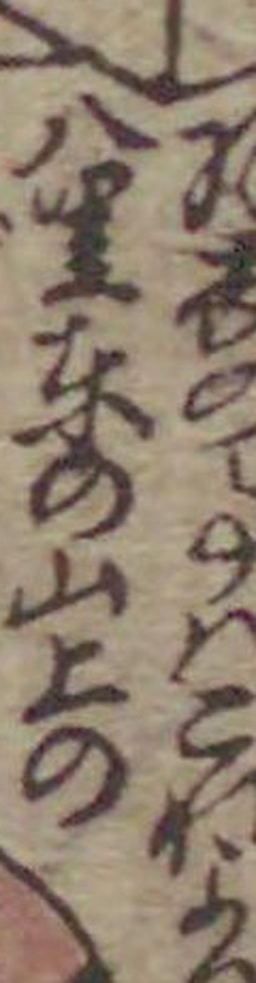八里東の山上の
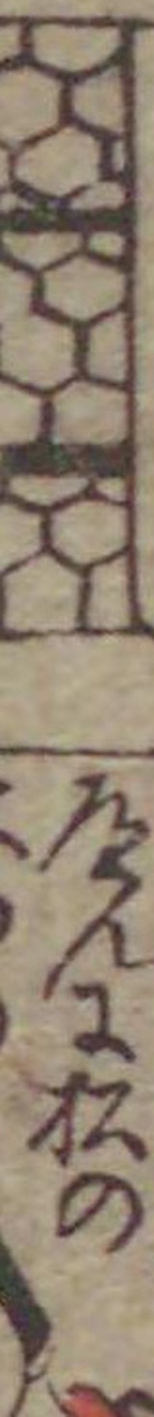へんに松の
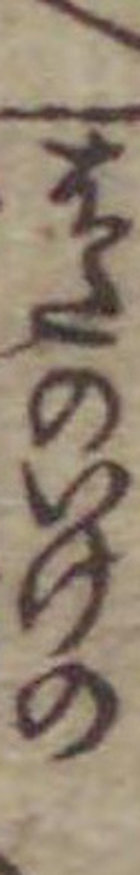はたのいけの
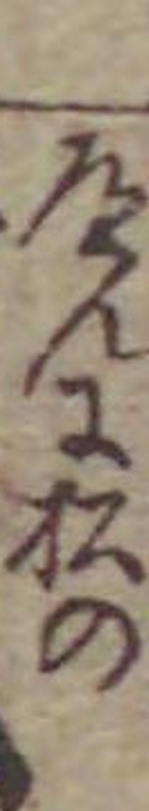へんに松の
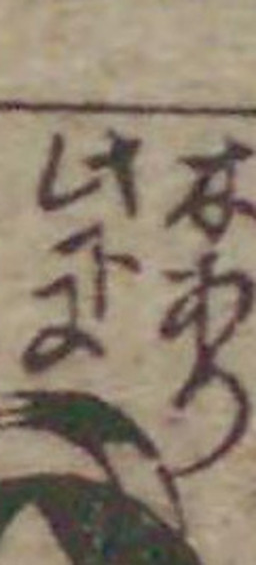此下に
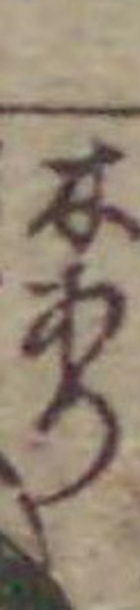木あり
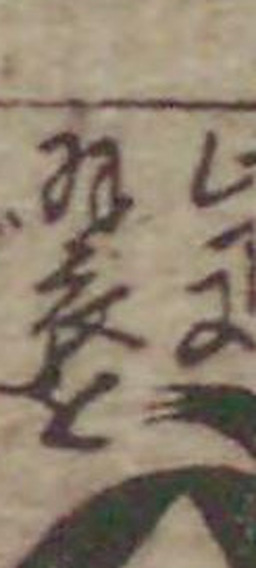羽衣を
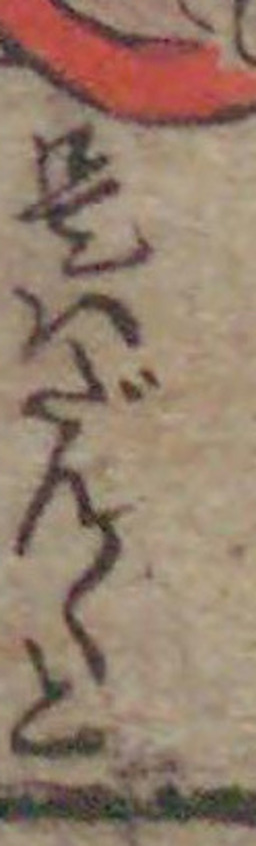是はだん〳〵と
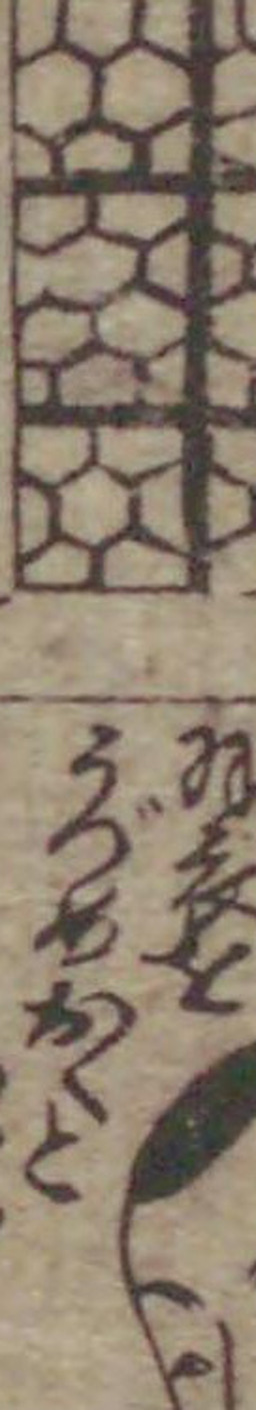うづめおくと
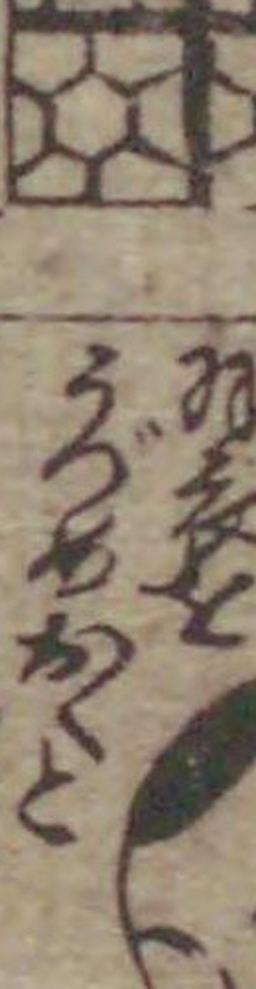うづめおくと
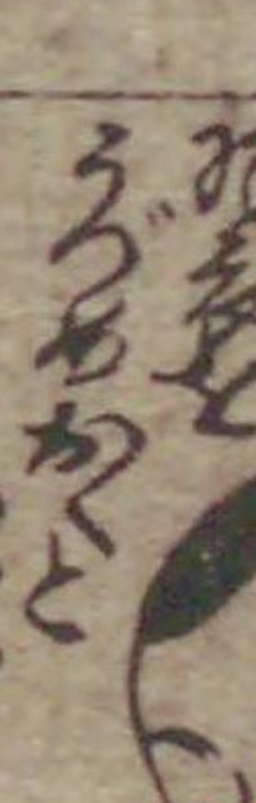うづめおくと
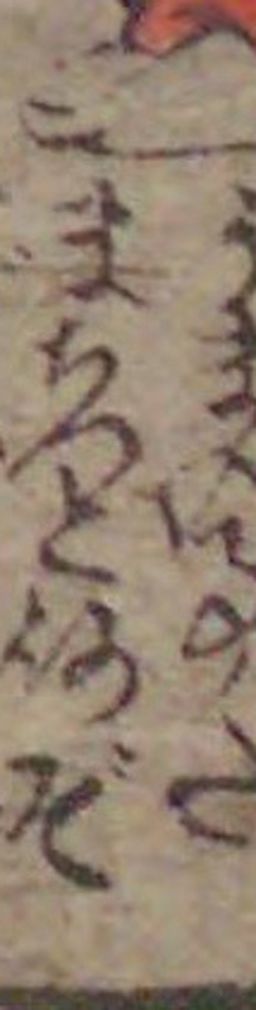まちつと何ぞ
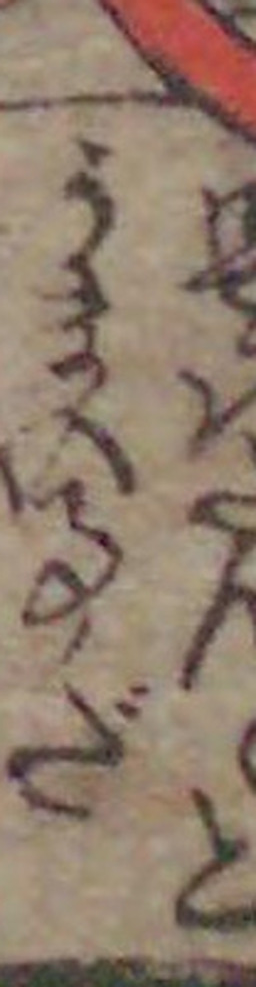うまい事だ
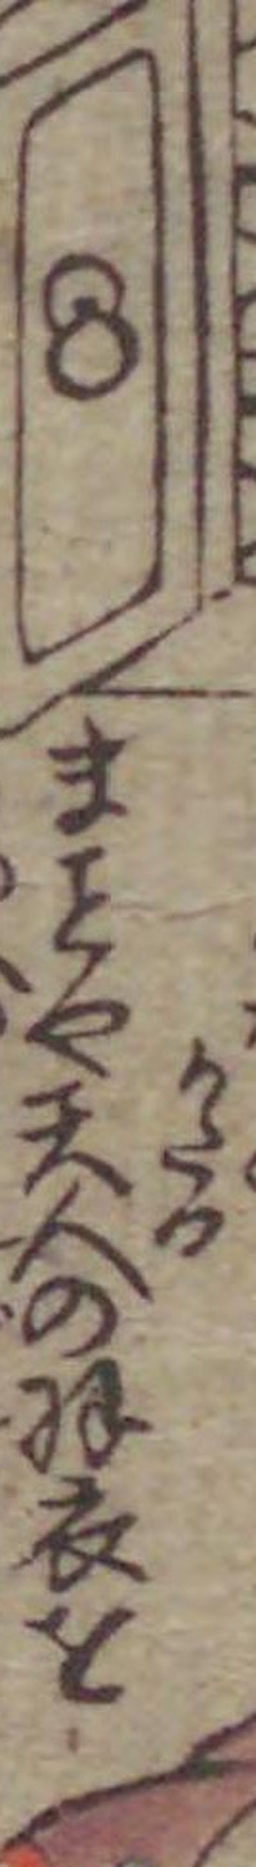まことや天人の羽衣を
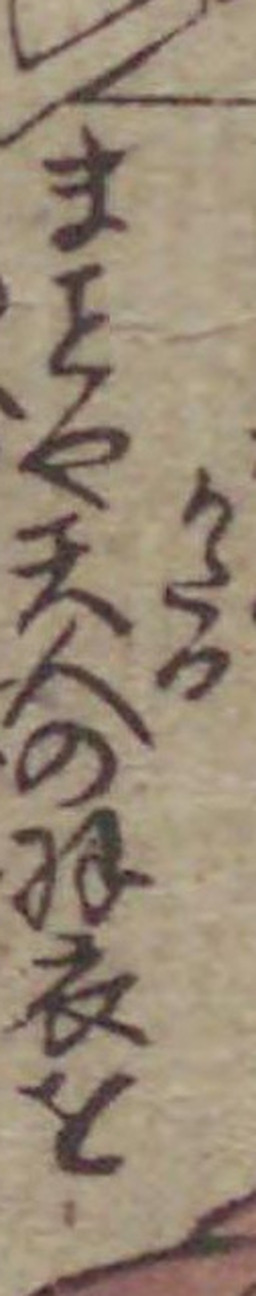まことや天人の羽衣を
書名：娜二代鉢木 5巻
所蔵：国立国会図書館 National Diet Library, JAPAN
